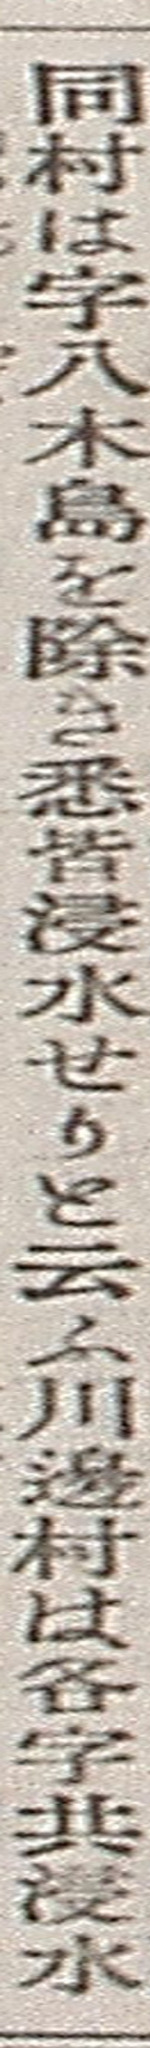同村は字八木島を除き悉皆浸水せりと云ふ川辺村は各字共浸水
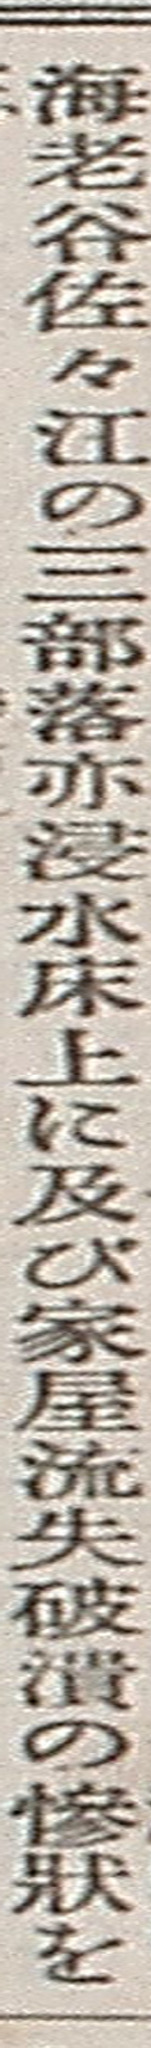海老谷佐々江の三部落亦浸水床上に及び家屋流失破潰の惨状を
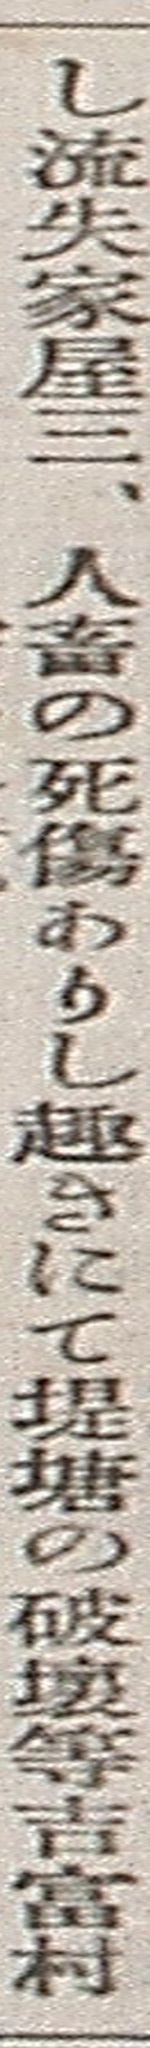し流失家屋三、人畜の死傷ありし趣きにて堤塘の破壊等吉富村
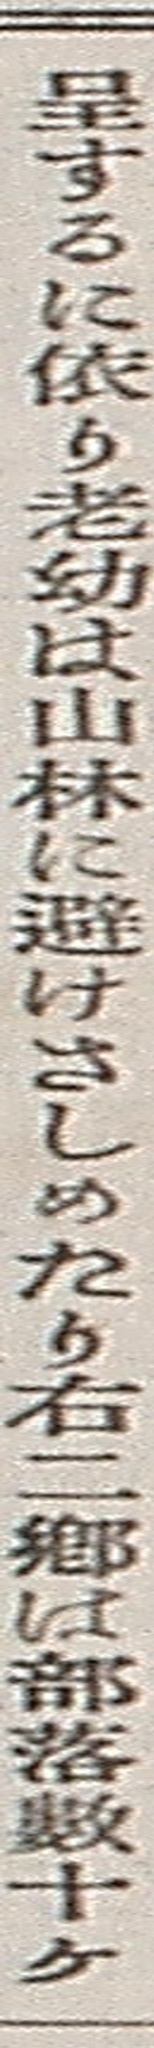呈するに依り老幼は山林に避けさしめたり右二郷は部落数十ヶ
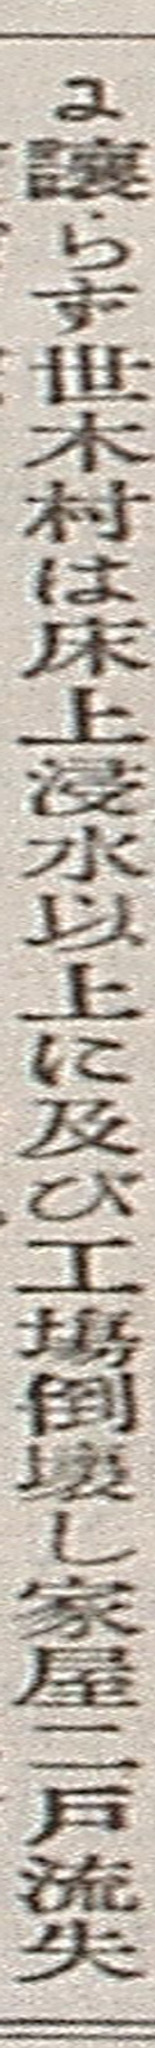に譲らず世木村は床上浸水以上に及び工場倒壊し家屋二戸流失
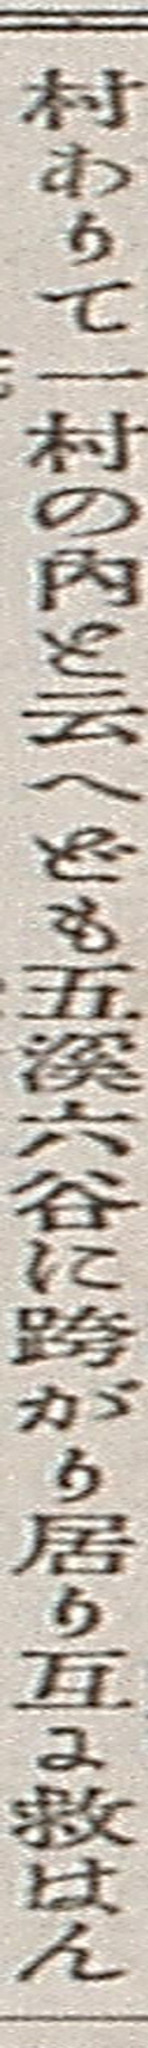村ありて一村の内と云へども五渓六谷に跨がり居り互に救はん
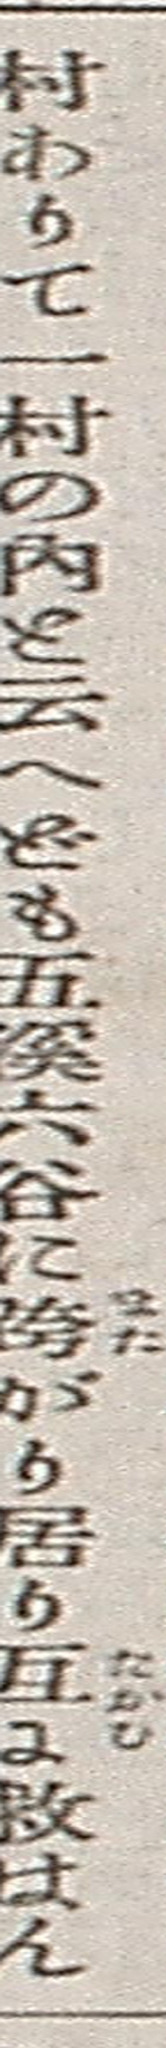村ありて一村の内と云へども五渓六谷に跨がり居り互に救はん
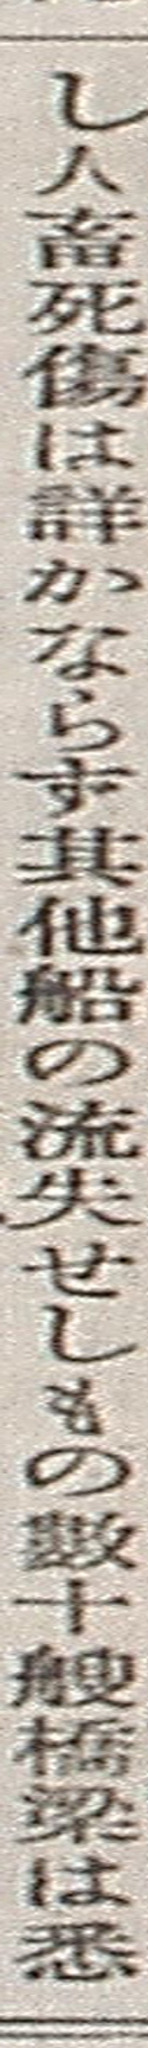し人畜死傷は詳かならず其他船の流失せしもの数十艘橋梁は悉
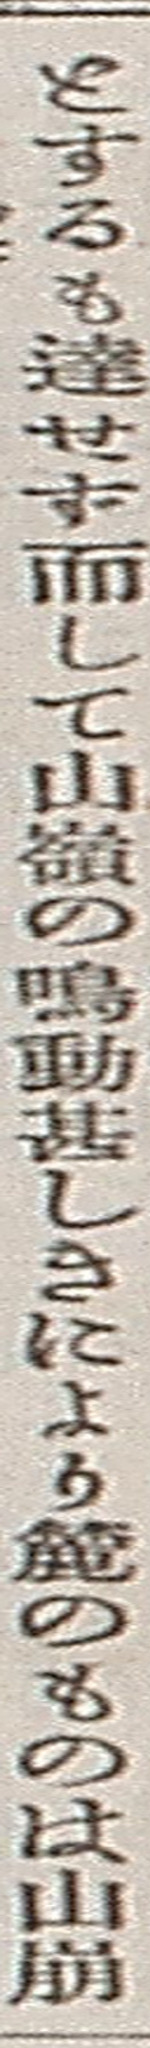とするも達せず而して山嶺の鳴動甚しきにより麓のものは山崩
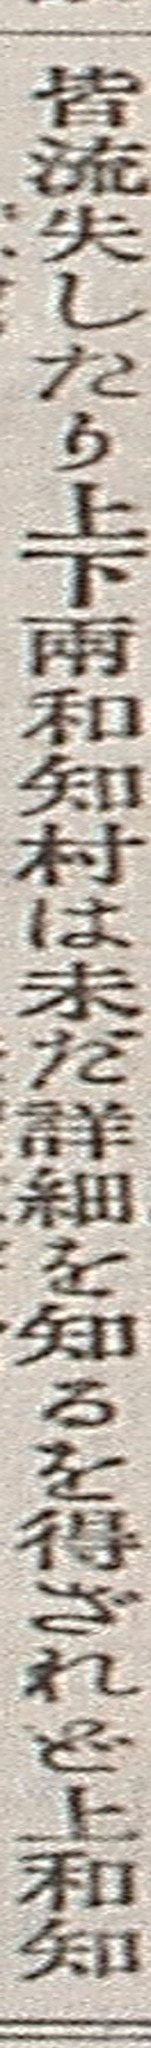皆流失したり上下両和知村は未だ詳細を知るを得ざれど上和知
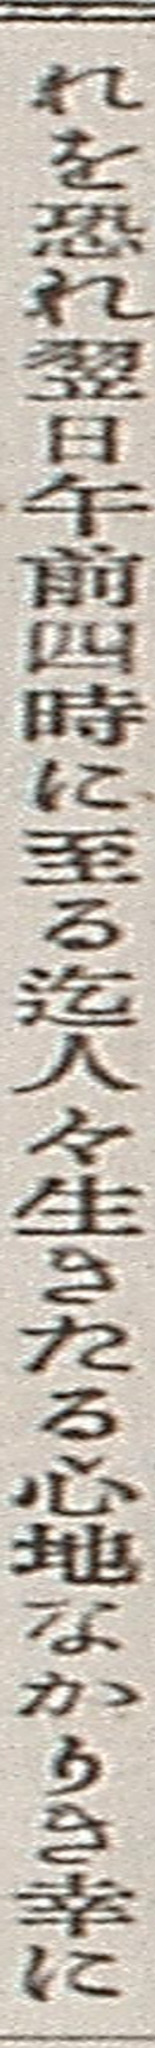れを恐れ翌日午前四時に至る迄人々生きたる心地なかりき幸に
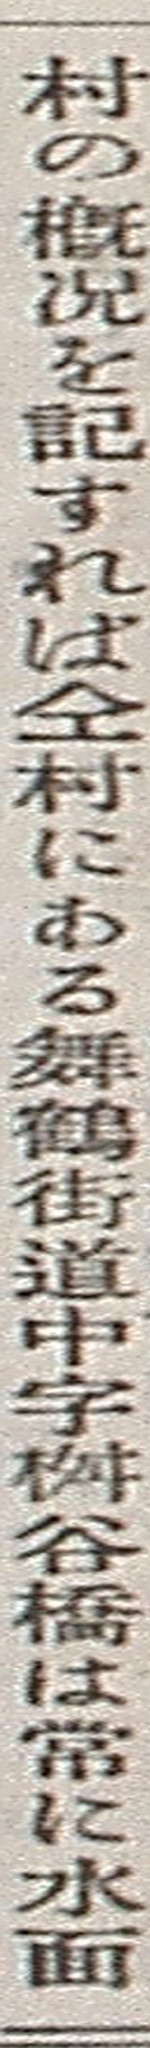村の概況を記すれば同村にある舞鶴街道中字桝谷橋は常に水面

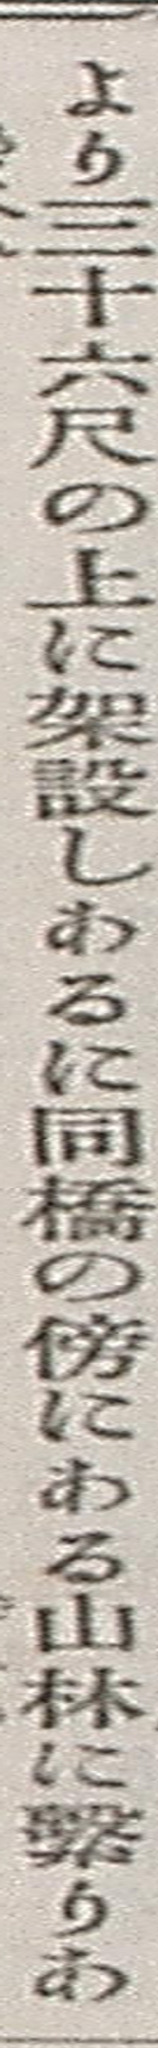より三十六尺の上に架設しあるに同橋に傍にある山林に繋りあ
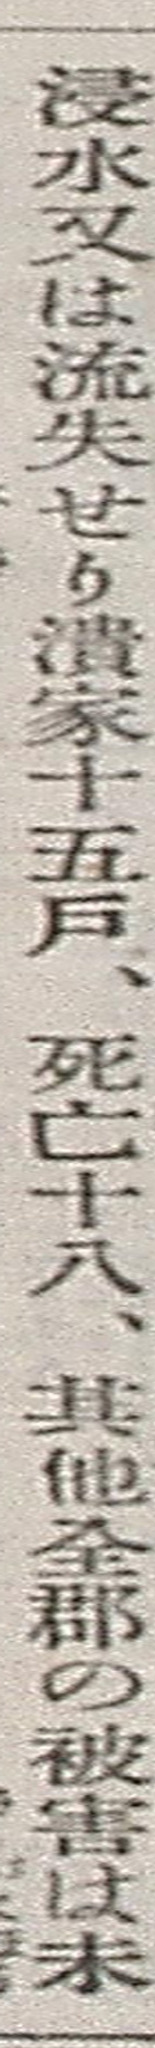浸水又は流失せり潰家十五戸、死亡十八、其他全郡の被害は未
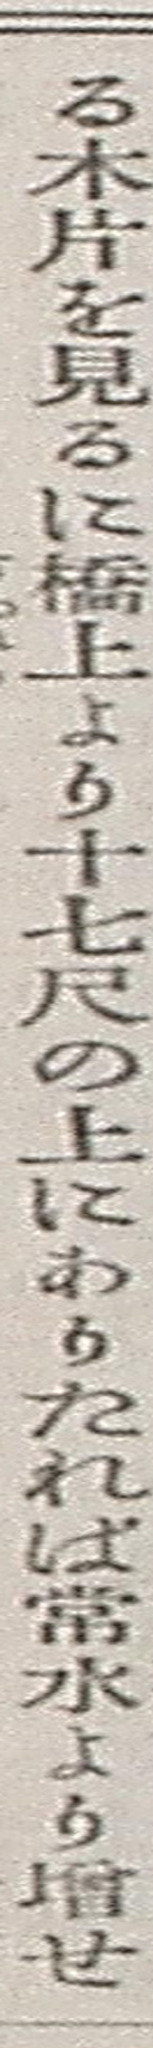る木片を見るに橋上より十七尺の上にありたれば常水より増せ
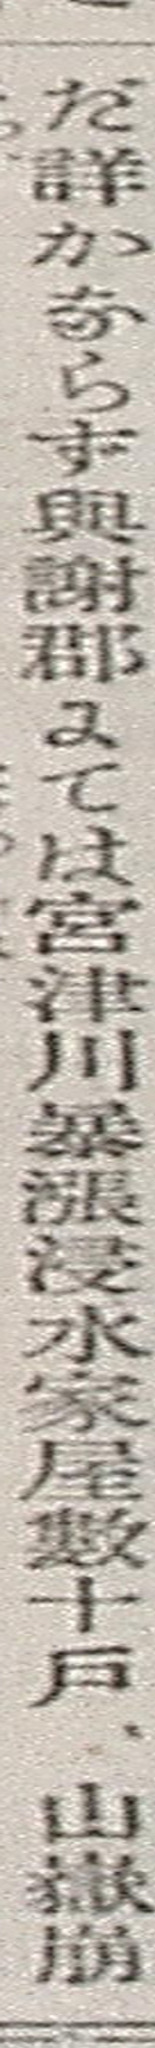だ詳かならず与謝郡にては宮津川暴漲浸水家屋敷十戸、山嶽崩
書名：風俗畫報臨時増刊第百二十六號　洪水被害録（中）
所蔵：東京大学地震研究所図書室 Earthquake Research Institute Library, The University of Tokyo, JAPAN
